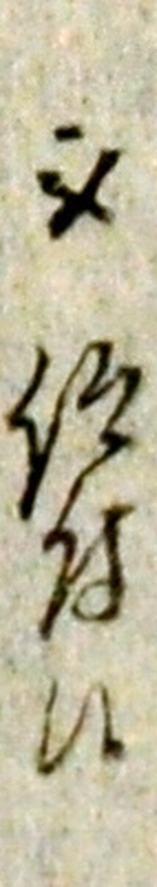披仰付候
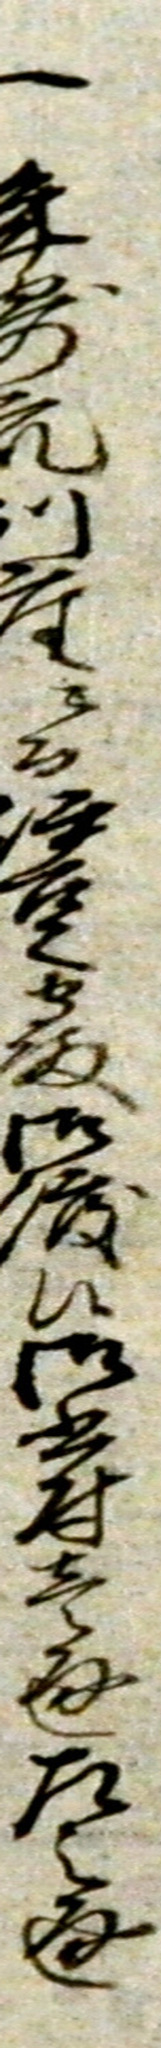一年寄衆列座二而伊豆守殿御渡候御書付一通左之通

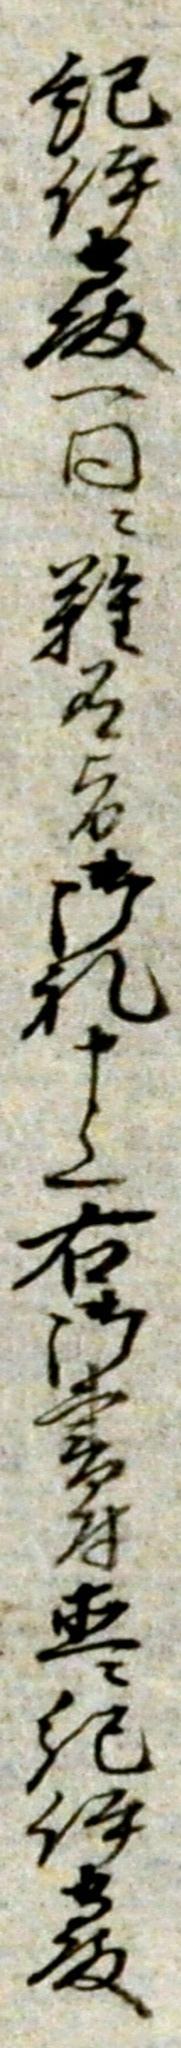紀伊守殿一同ニ難有旨御礼申上右御書付直ニ紀伊守殿
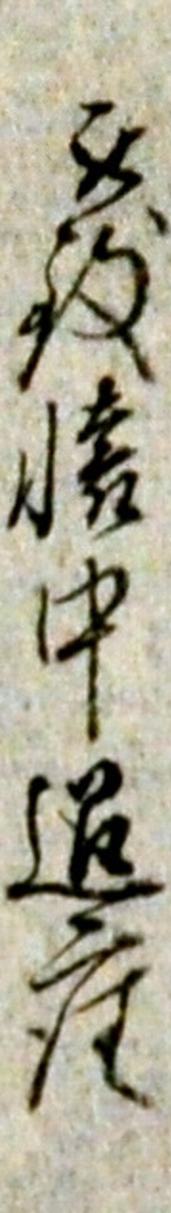被致懐中退座
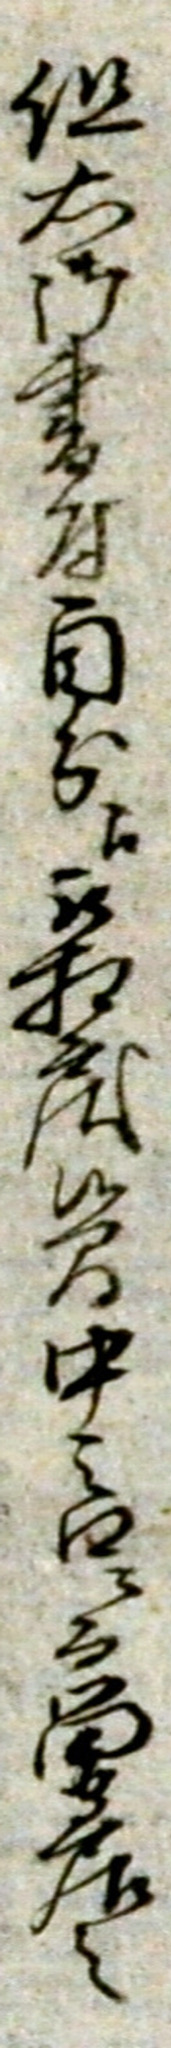但し右御書付自分江被相戻候間中之間二而留守居之
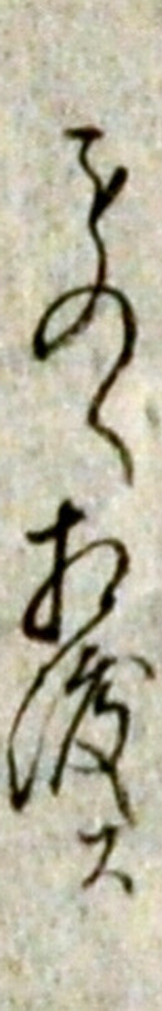ものへ相渡ㇲ
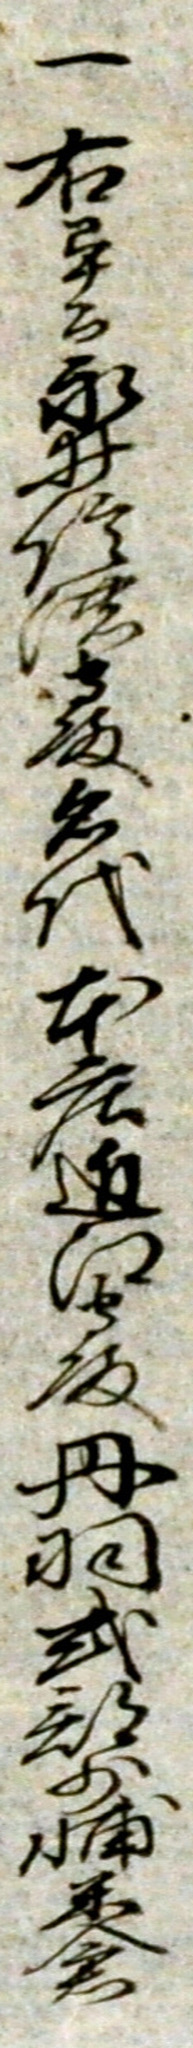一右畢而永井信濃守殿名代本庄近江守殿丹羽式部少輔米倉
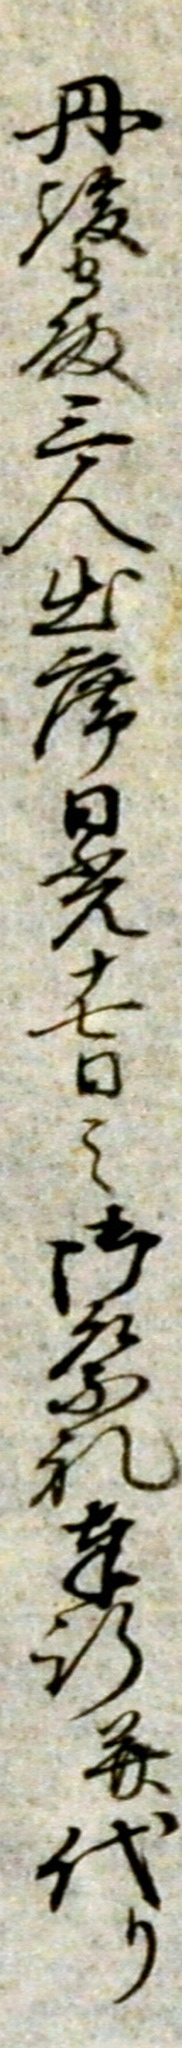後丹守殿三人出席日光十七日之御祭礼奉行幷代り
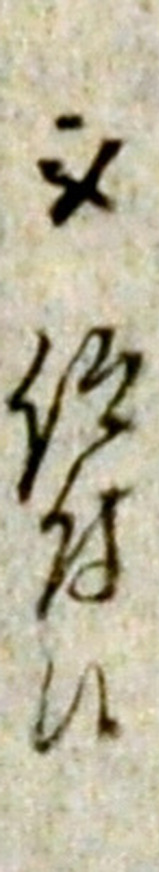被仰付候
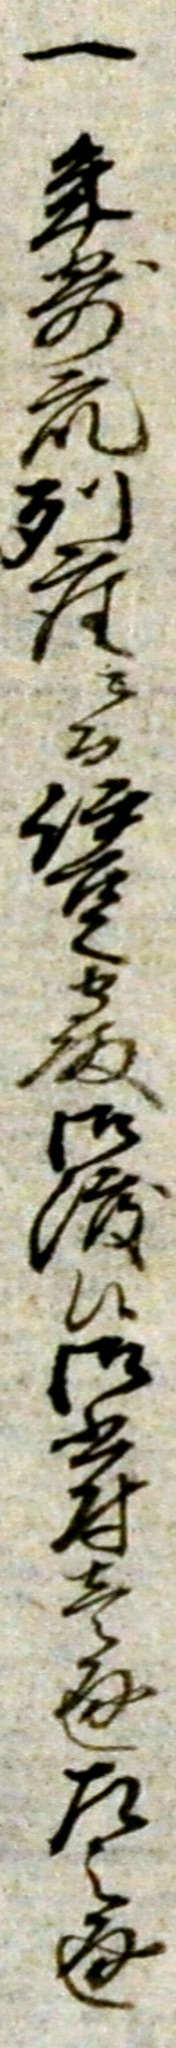一年寄衆列座二而伊豆守殿渡候御書付壱通左之通
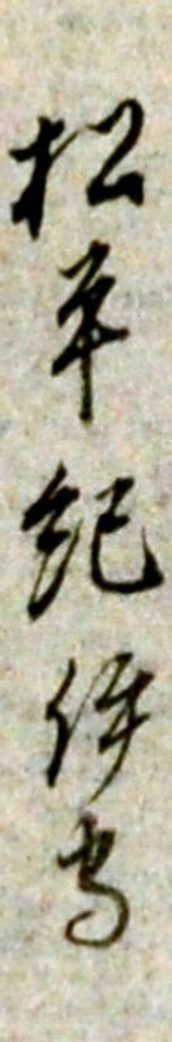松平紀伊守
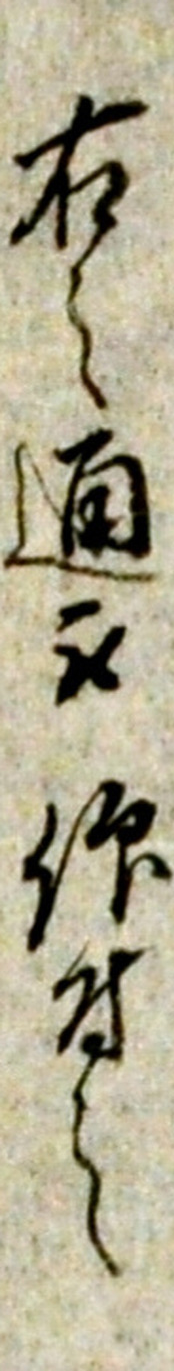右之通被仰付候
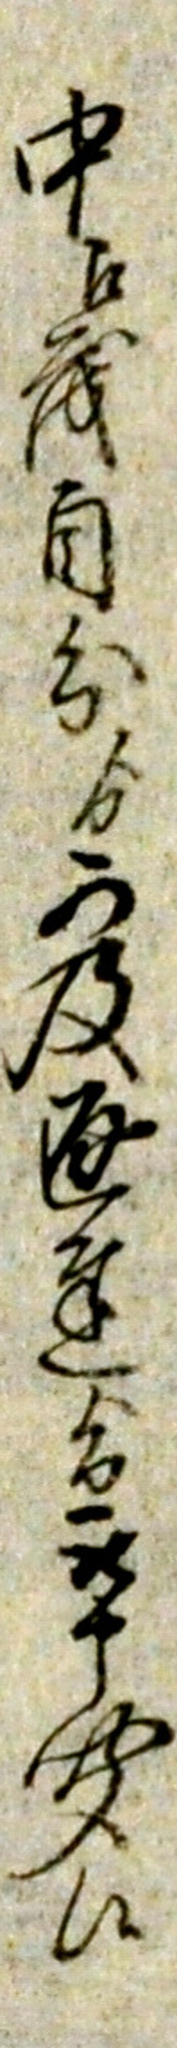中江茂自分ゟ可及通達旨被申聞候
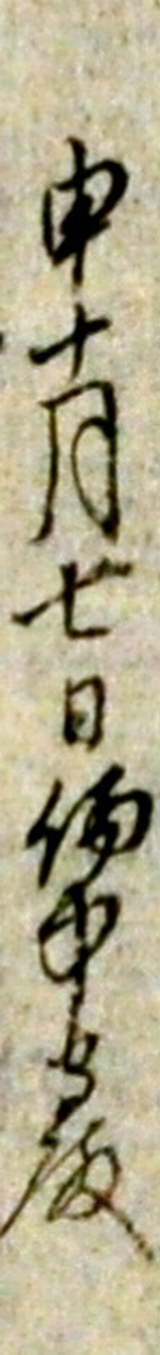申十月七日備中守殿
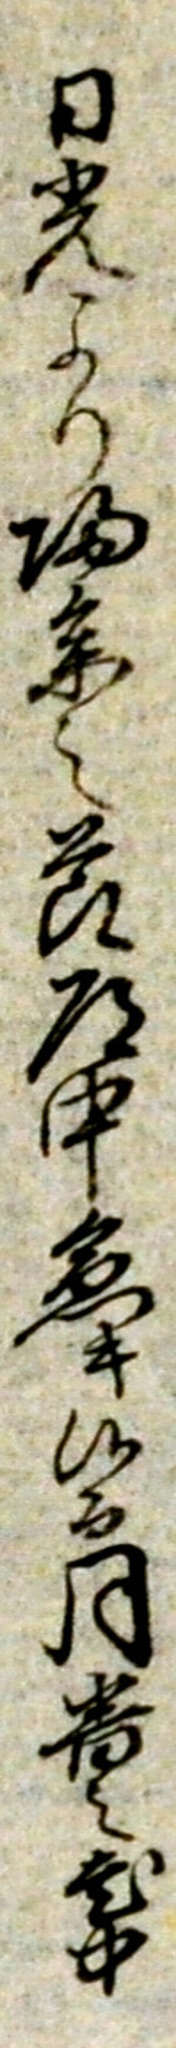日光より帰参之節道中急キ候而月番老中
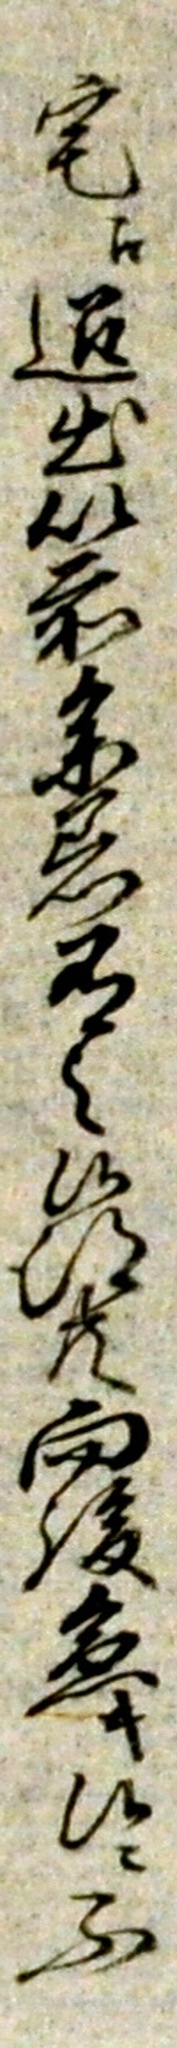宅江以前参着有之候得共向後急キ候ニ
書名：日光御名代相勤候節ノ留
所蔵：伊那市立高遠町図書館・合同会社AMANE
